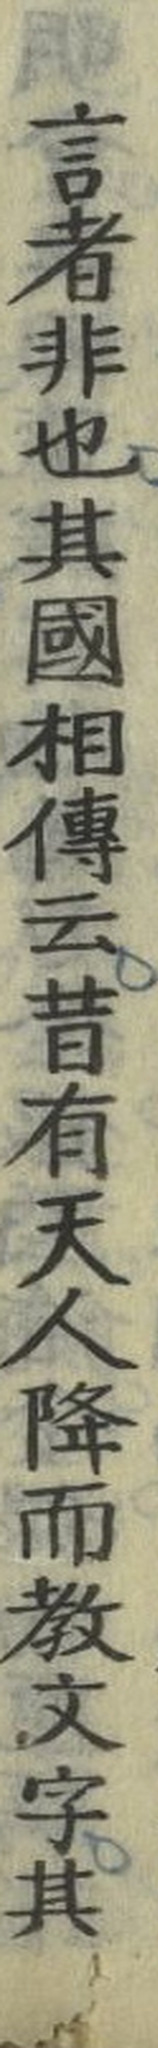言者非也。其國相傳云。昔有天人降而教文字。其
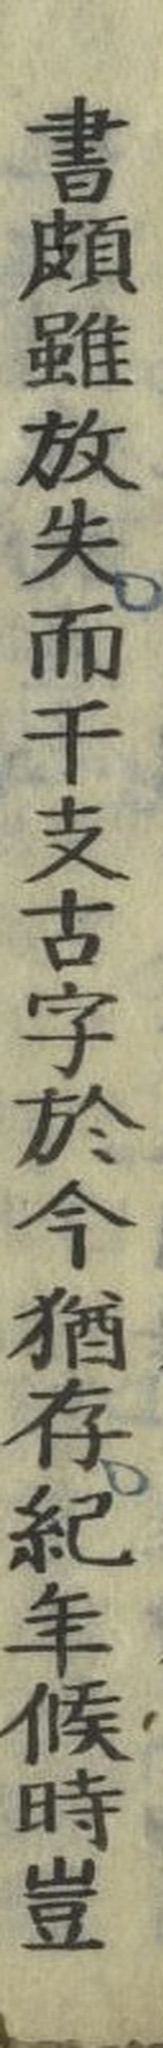書頗雖放失。而干支古字於今猶存。紀年候時豈
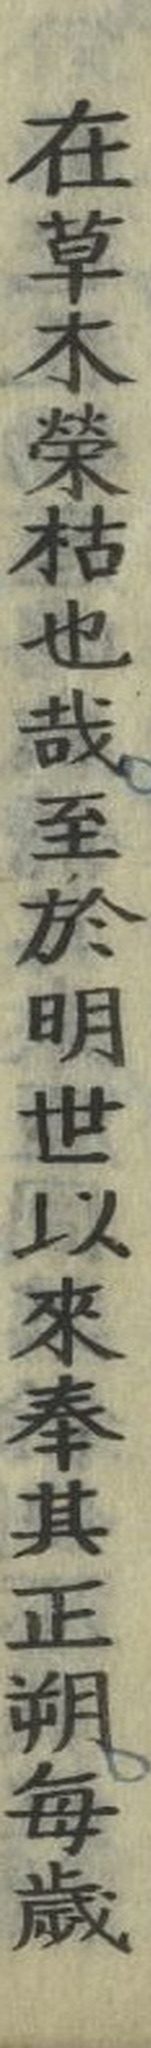在草木榮枯也哉。至於明世以來奉其正朔。每歲
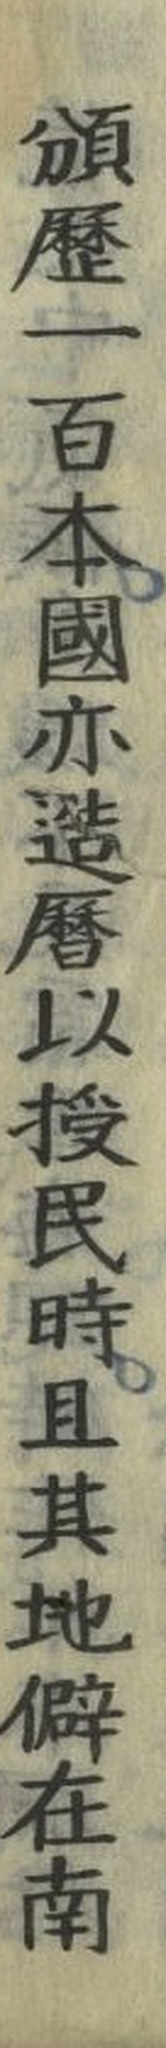頒歷一百本。國亦造曆以授民時。且其地僻在南

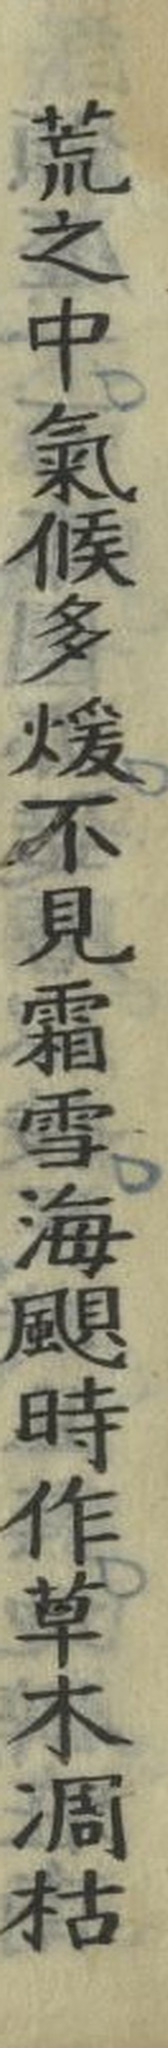荒之中。氣候多煖。不見霜雪。海颶時作。草木凋枯
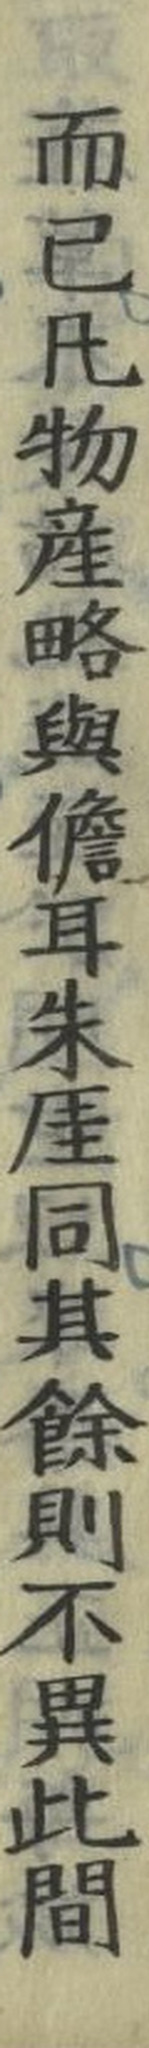而已。凡物産略與儋耳朱厓同。其餘則不異此間
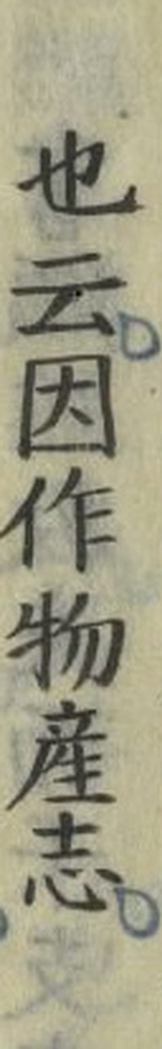也云。因作物産志。
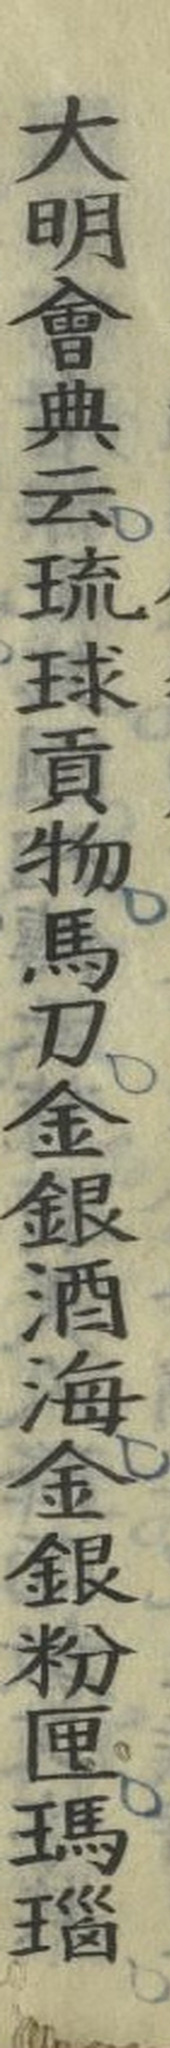大明會典云。琉球貢物。馬刀。金銀酒海。金銀粉匣。瑪瑙。
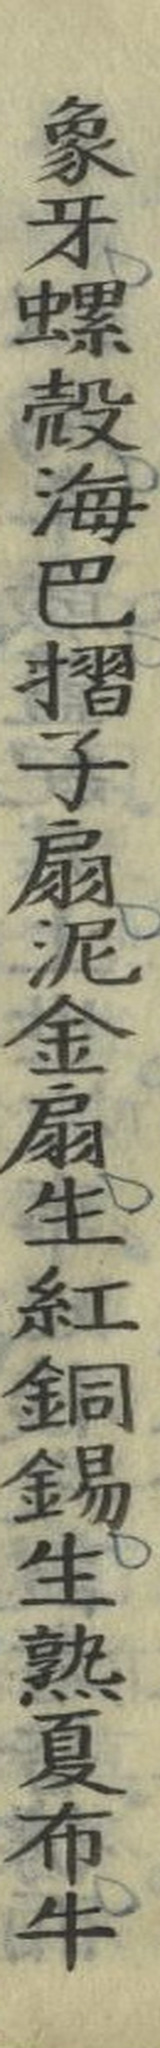象牙。螺殻。海巴。摺子扇。泥金扇。生紅銅錫。生熟夏布。牛
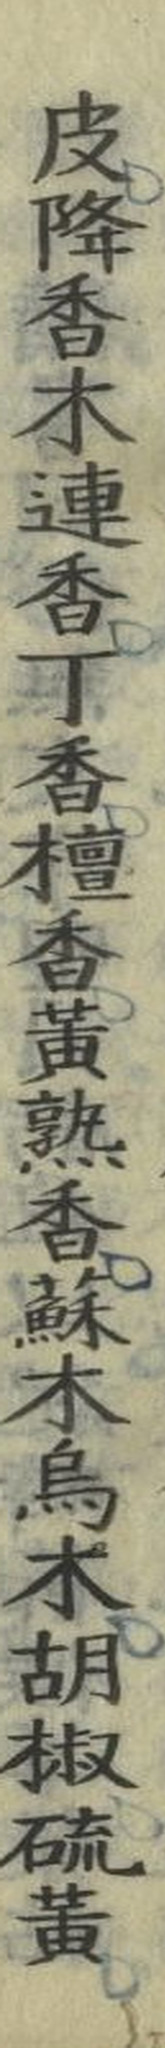皮。降香木連香。丁香。檀香。黃熟香。蘇木烏木。胡椒。硫黃。
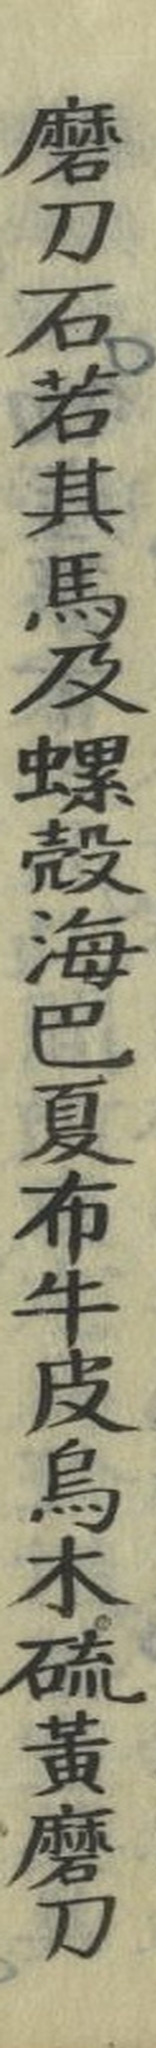磨刀石。若其馬及螺殻海巴夏布牛皮烏木硫黃磨刀
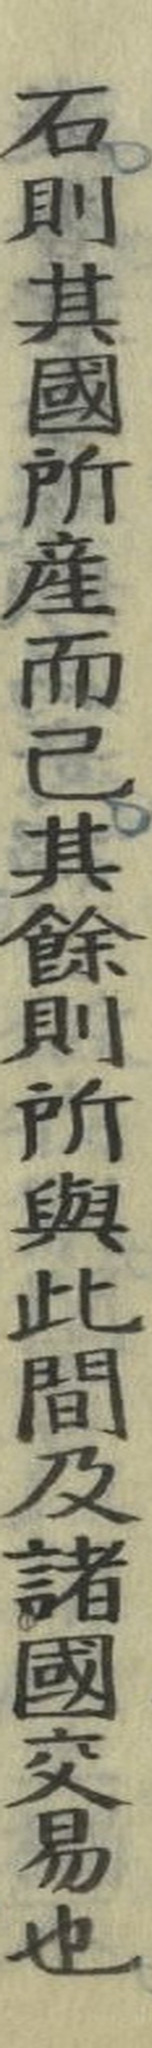石。則其國所産而已。其餘則所與此間及諸國交易也。
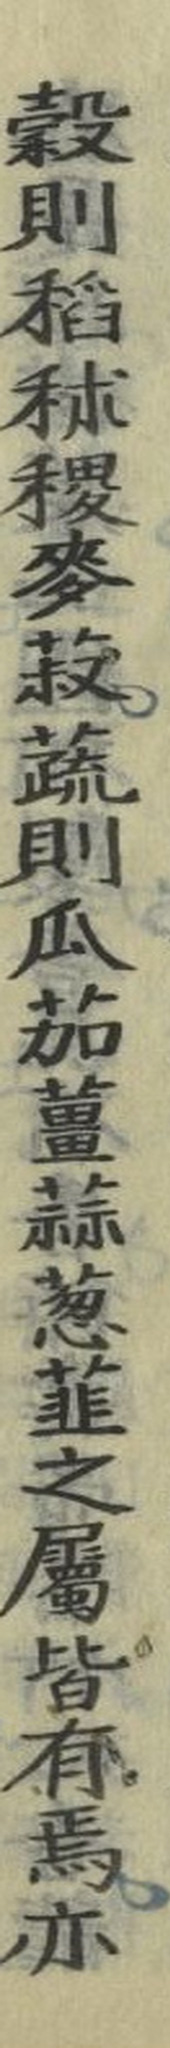穀則稻秫稷麥菽。蔬則瓜茄薑蒜葱韮之屬皆有焉。亦
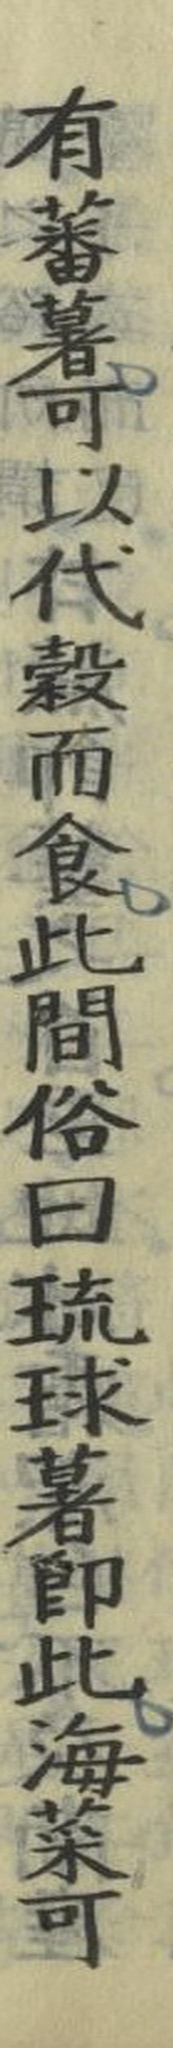有蕃薯。可以代穀而食。此間俗曰琉球薯卽此。海菜可
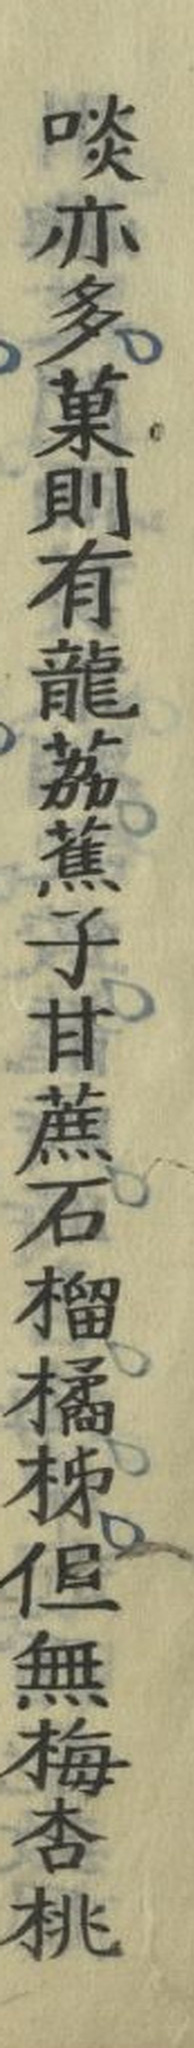啖亦多。菓則龍茘。蕉子。甘蔗。石榴。橘。柹。但無梅杏桃
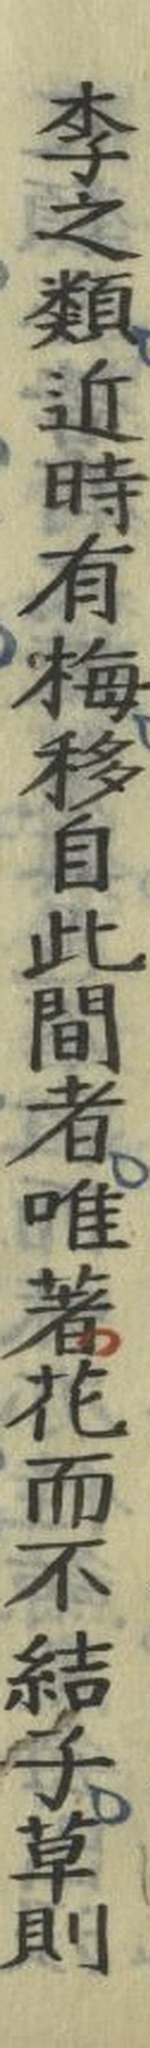李之類。近時有梅。移自此間者。唯著花而不結子。草則
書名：南島志
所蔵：University of the Ryukyus Library
